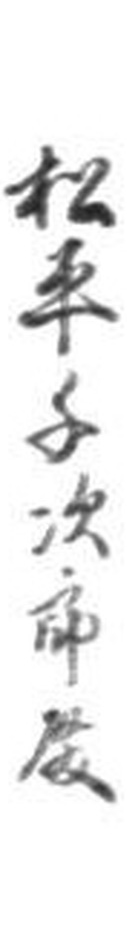松平千次郎殿
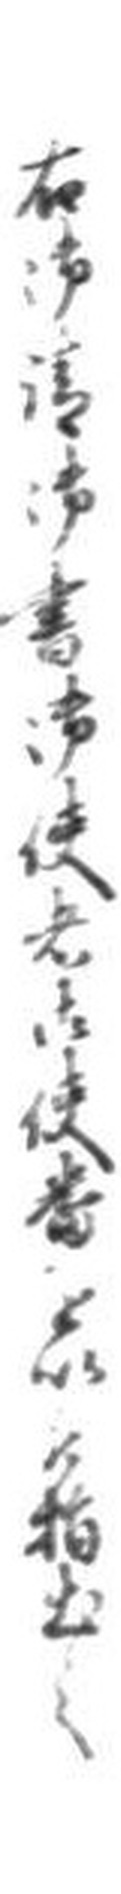右御請御書御使者御使番を以被指出之
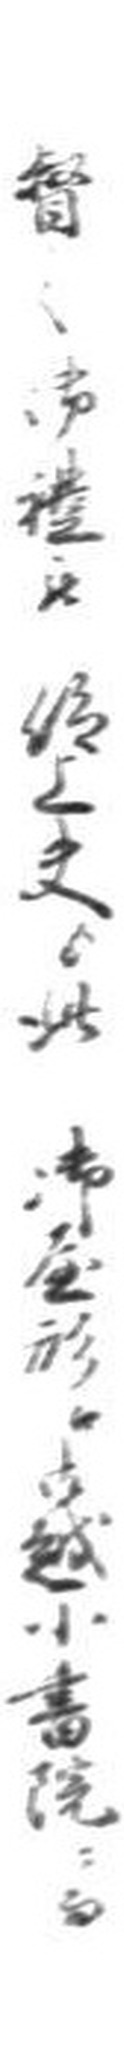督之御礼被仰上夫ゟ此御屋形江御越小書院ニ而
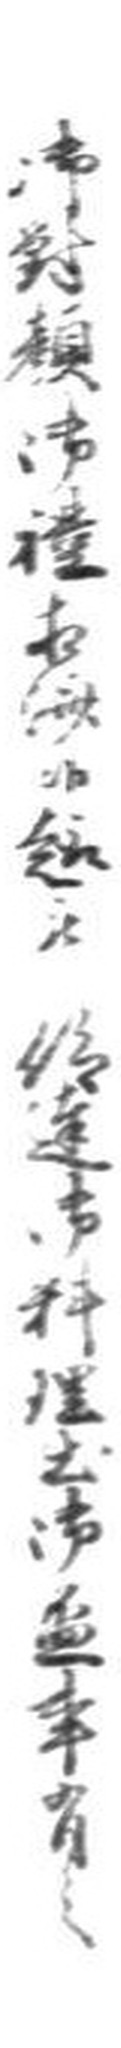御対顔御礼相済候趣被仰達御料理出御盃事有之
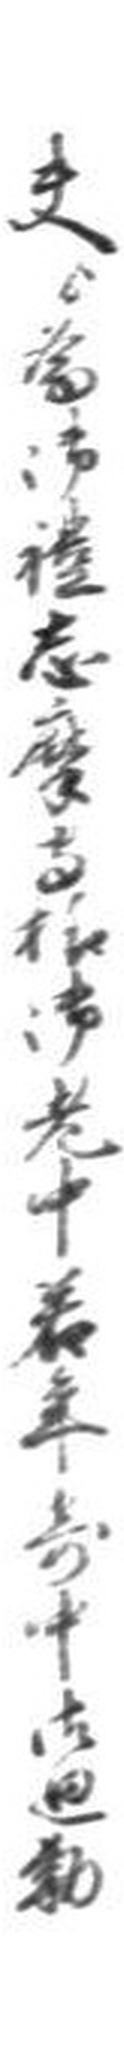夫ゟ為於御礼志摩守様御老中若年寄中御廻勤

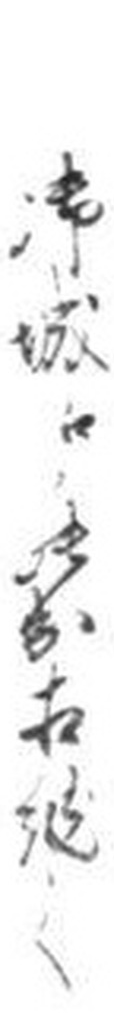御城江罷出相納之
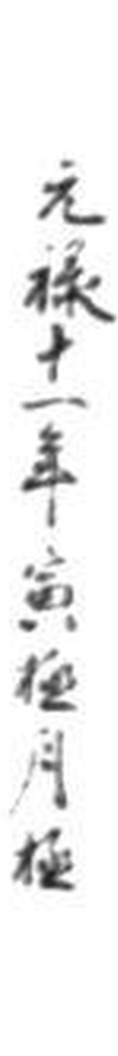元禄十一年寅極月極
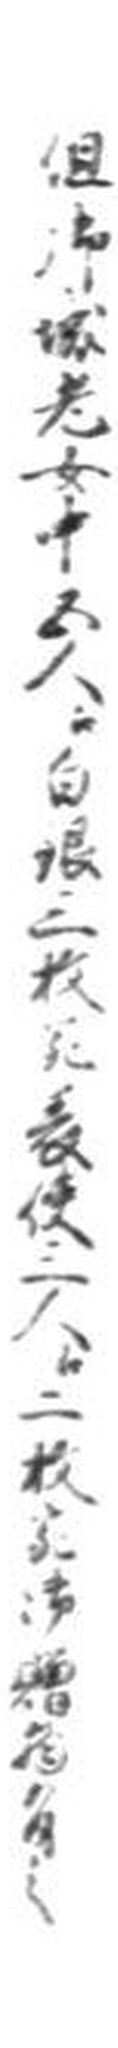但御城老女中五人江白銀三枚宛表使三人江二枚宛御贈物有之
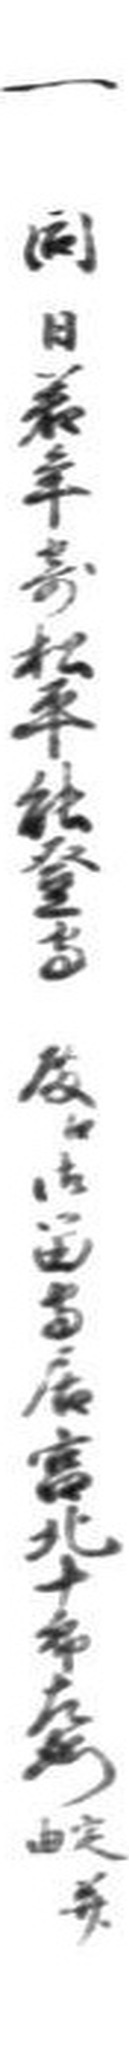一同日若年寄松平能登守殿江御留守居宮北十郎左衛門定由并
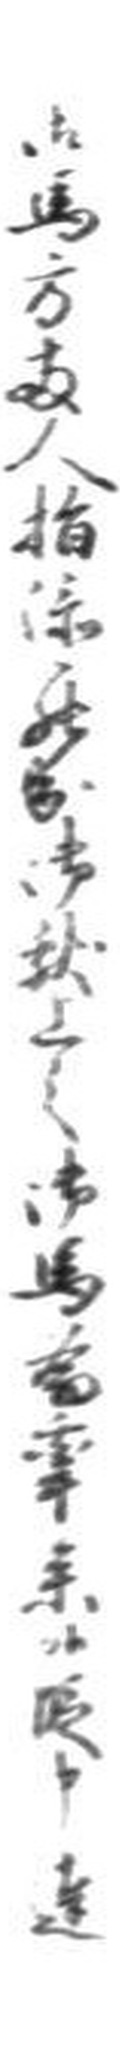御馬方両人指添罷出御献上之御馬為牽参候段申達
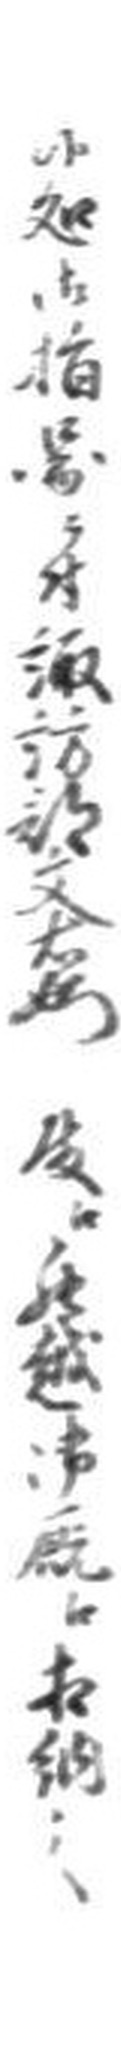候処御指図ニ付諏訪部文右衛門殿江罷越御厩江相納之
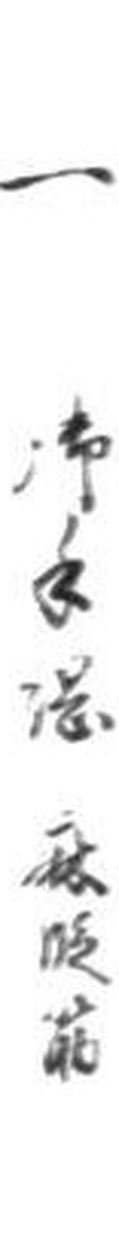一御手綱麻段筋
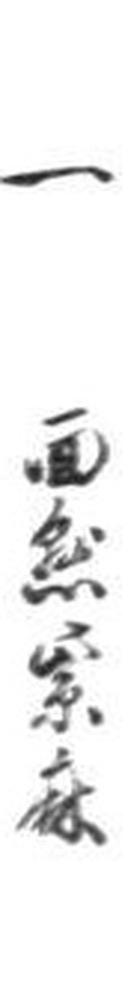一面懸紫麻

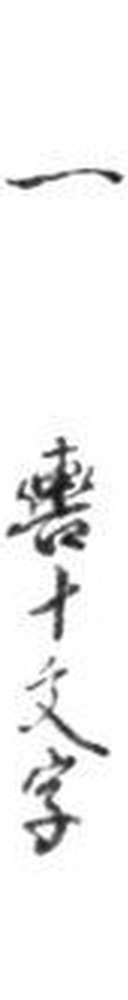一轡十文字
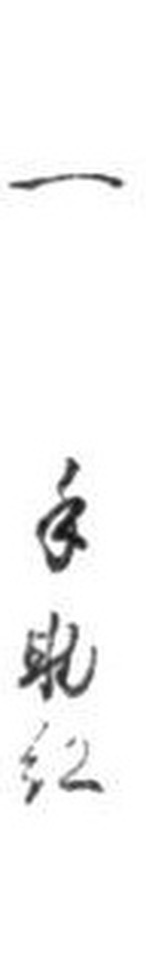一手助紅
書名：家譜 三十八 宗矩公 従享保九年五月到享保九年十二月
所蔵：福井県文書館 Fukui Prefectural Archives
